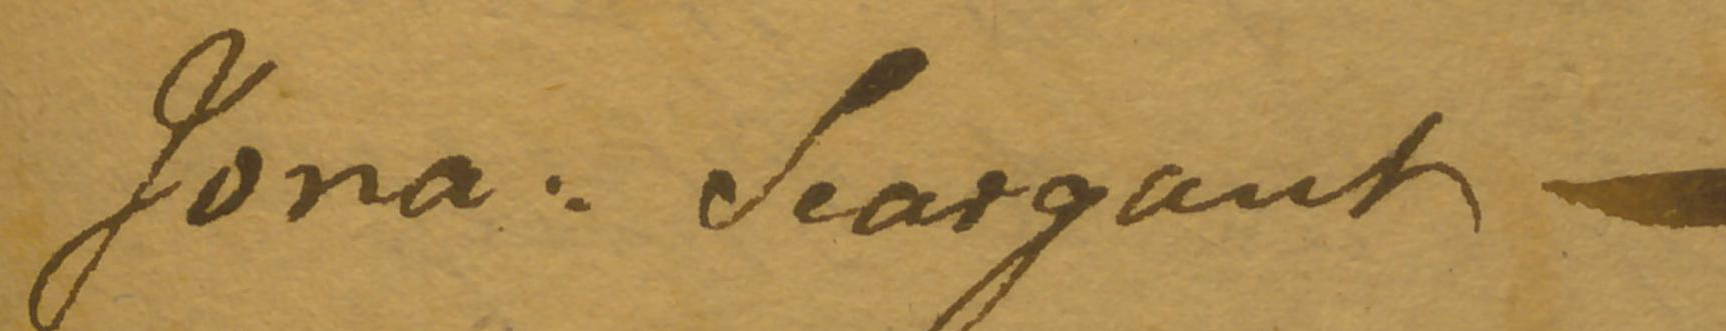Jona: Seargant
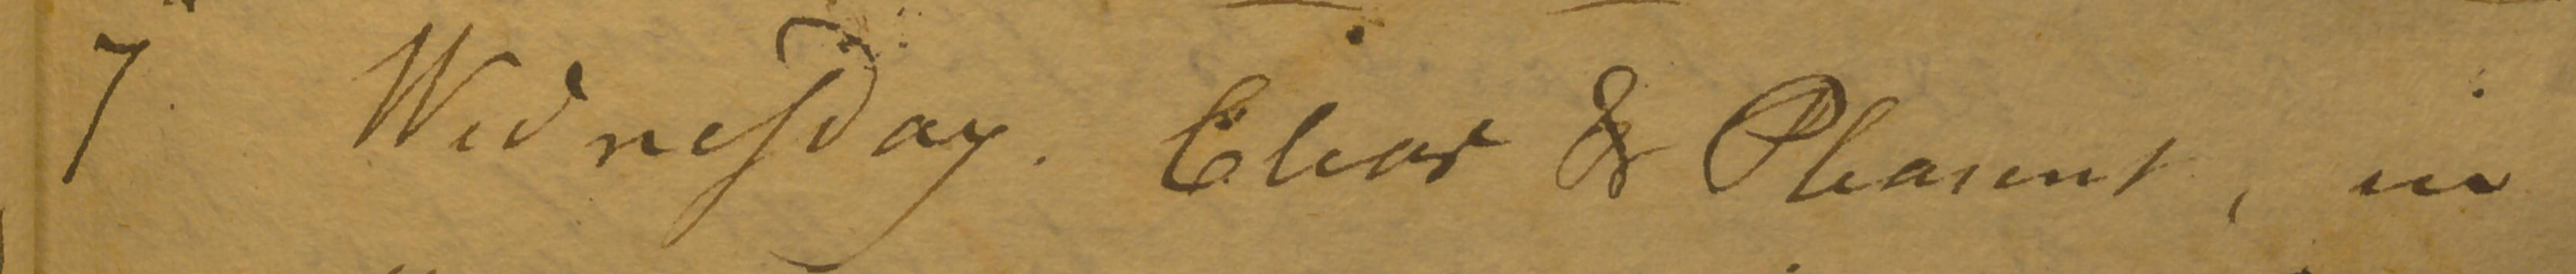7 Wednesday. Clear & Pleasent, in
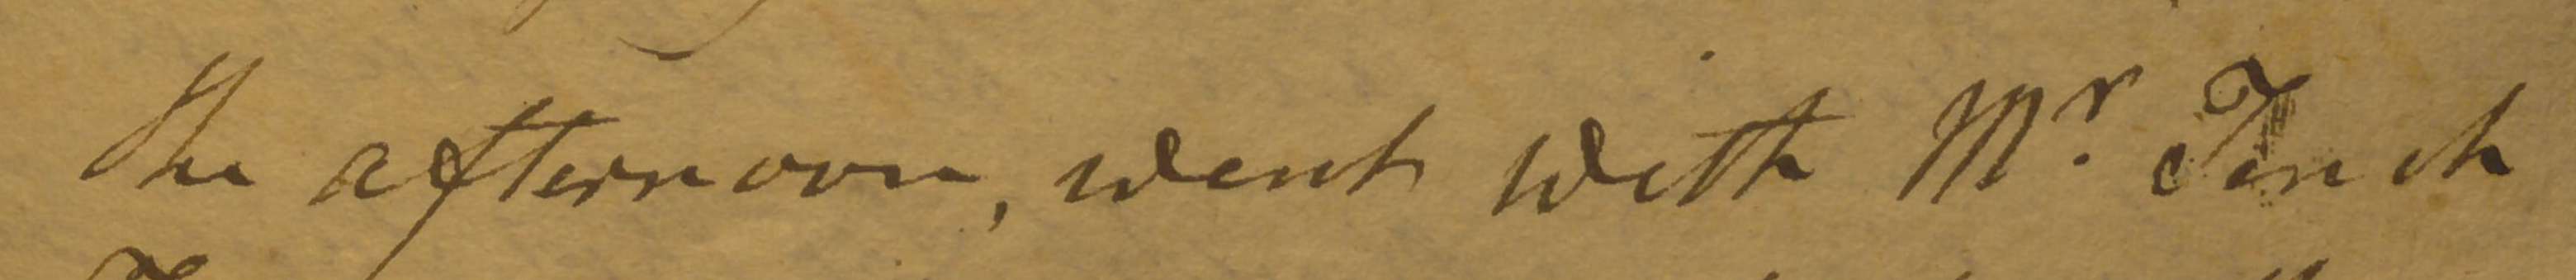the afternoon went with M^r. Tench
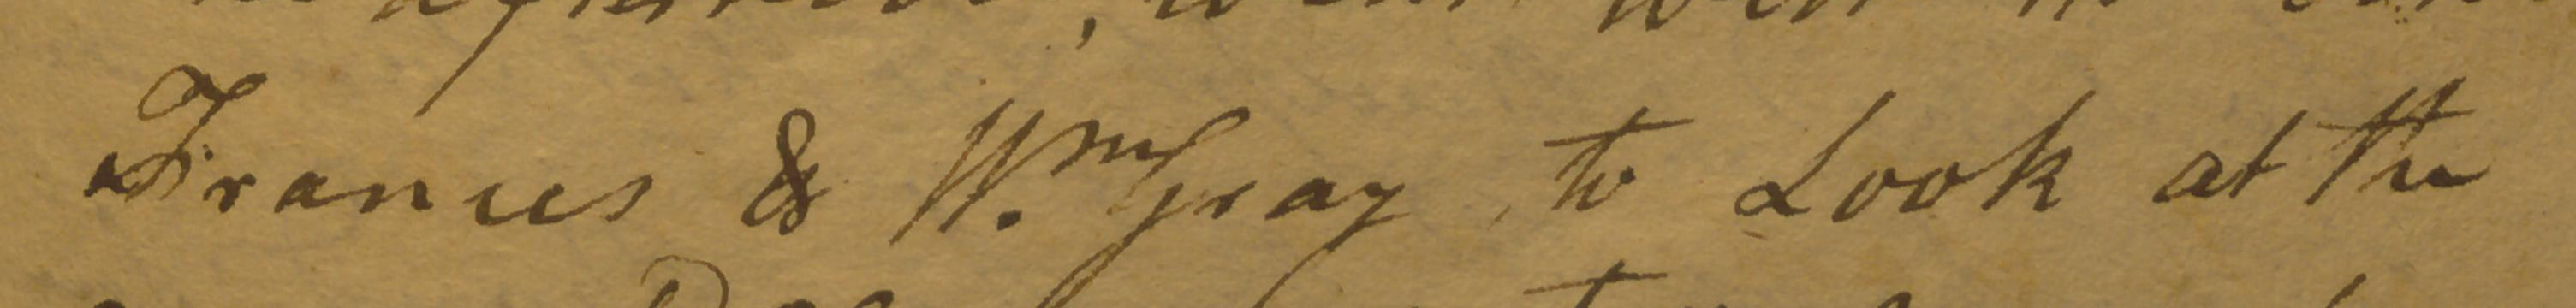Frances & W^m. Gray to Look at the
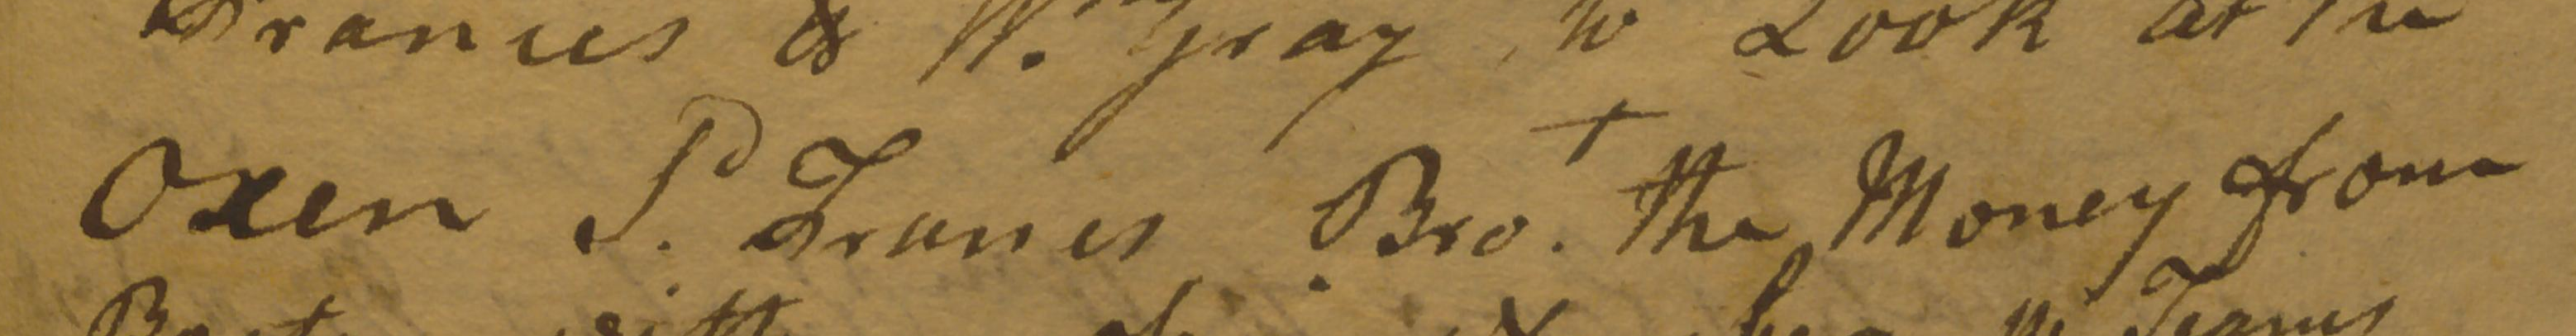oxen s^d. Franes Bro^t. the Money from
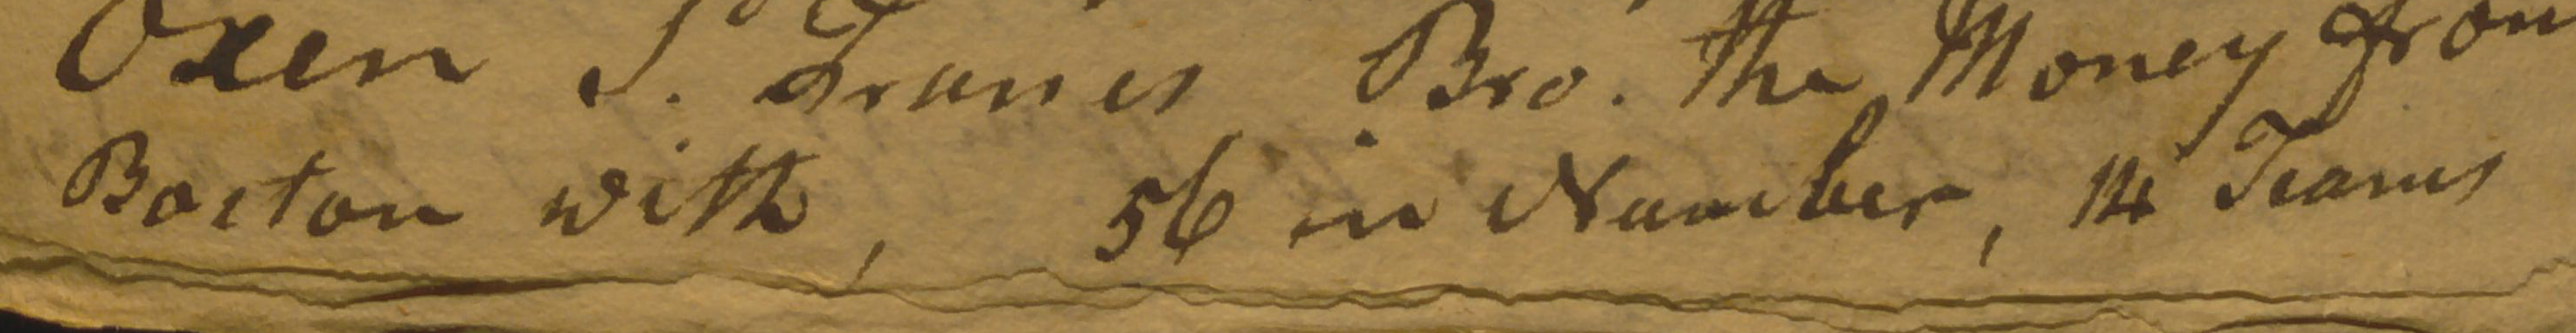Boston with 56 in Number, 14 Teams
